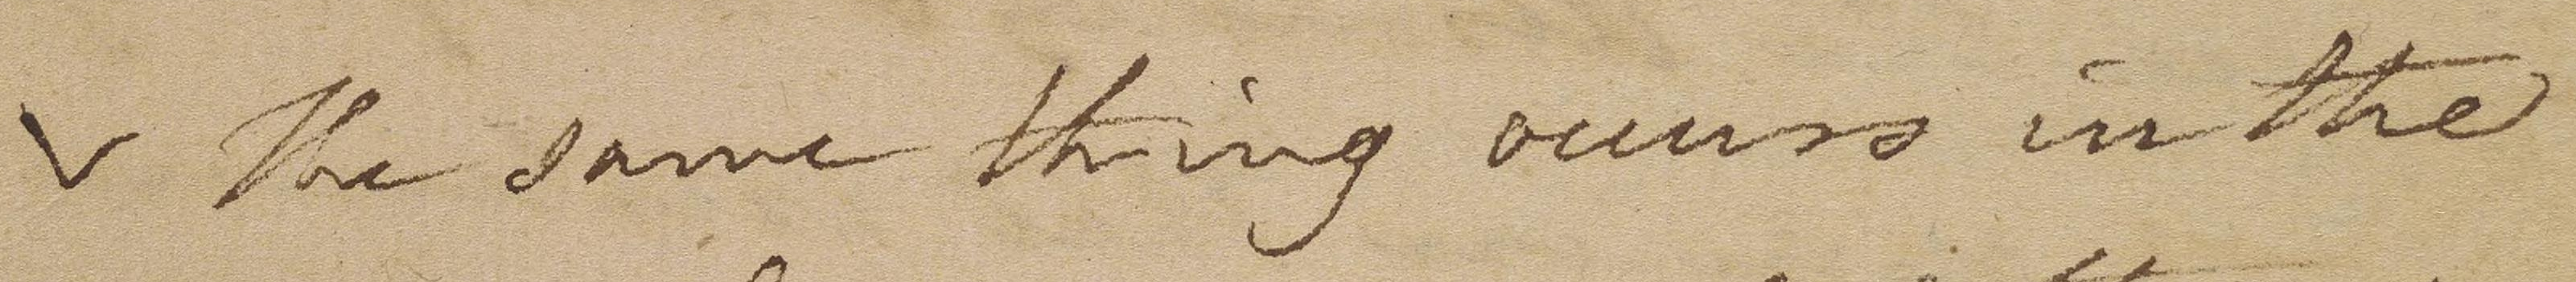V The same thing occurs in the
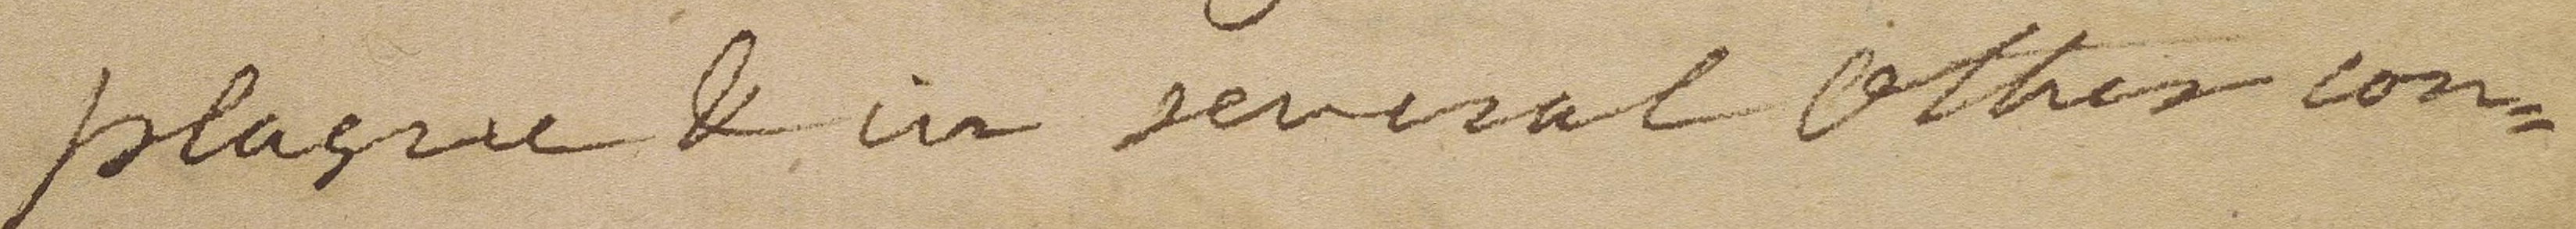plague & in several other con-
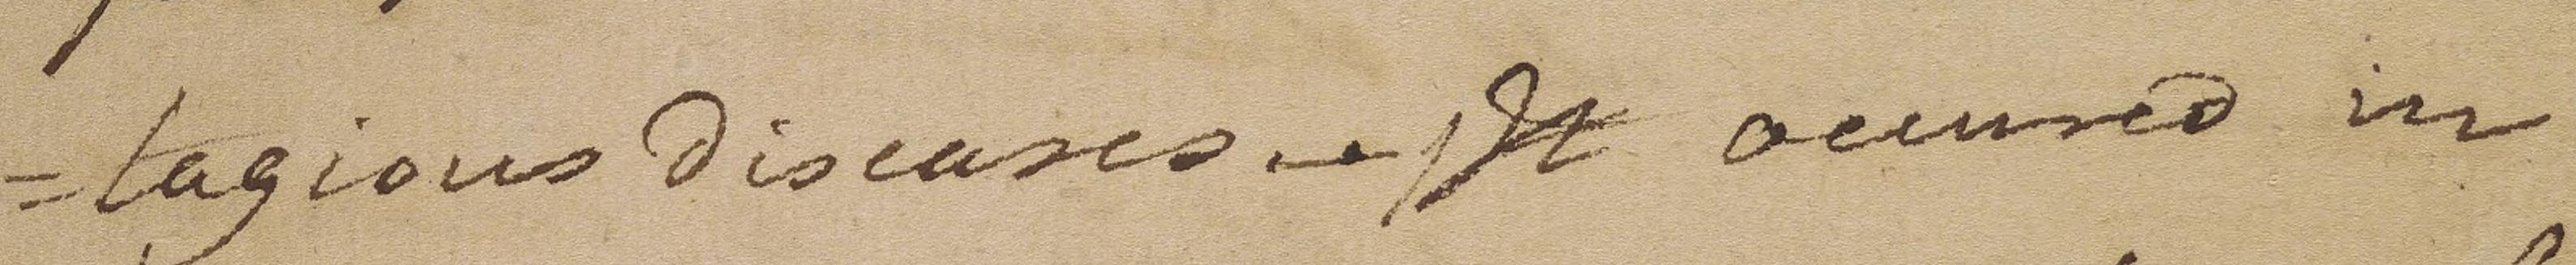-tagious diseases. It occured in
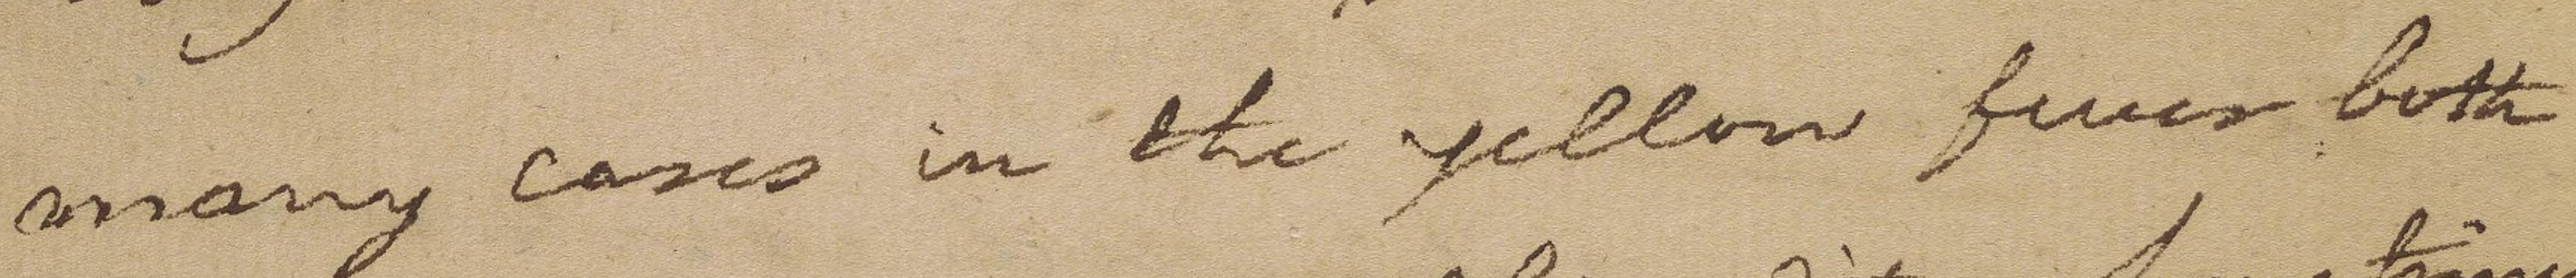many cases in the yellow fever both
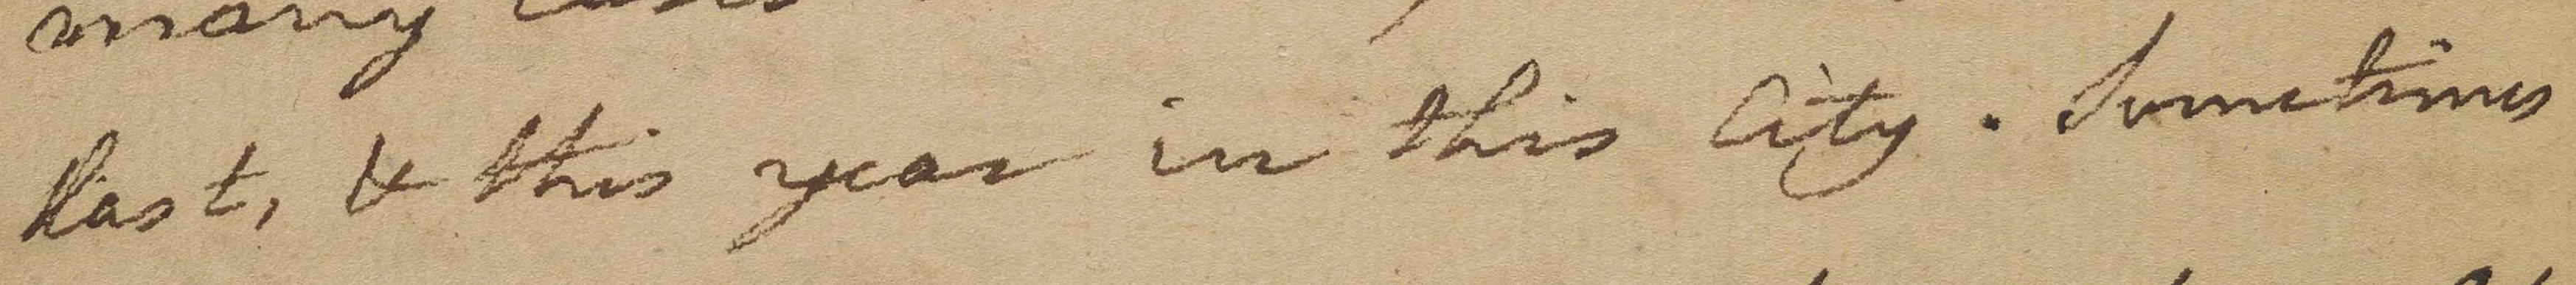last, & this year in this city. Sometimes
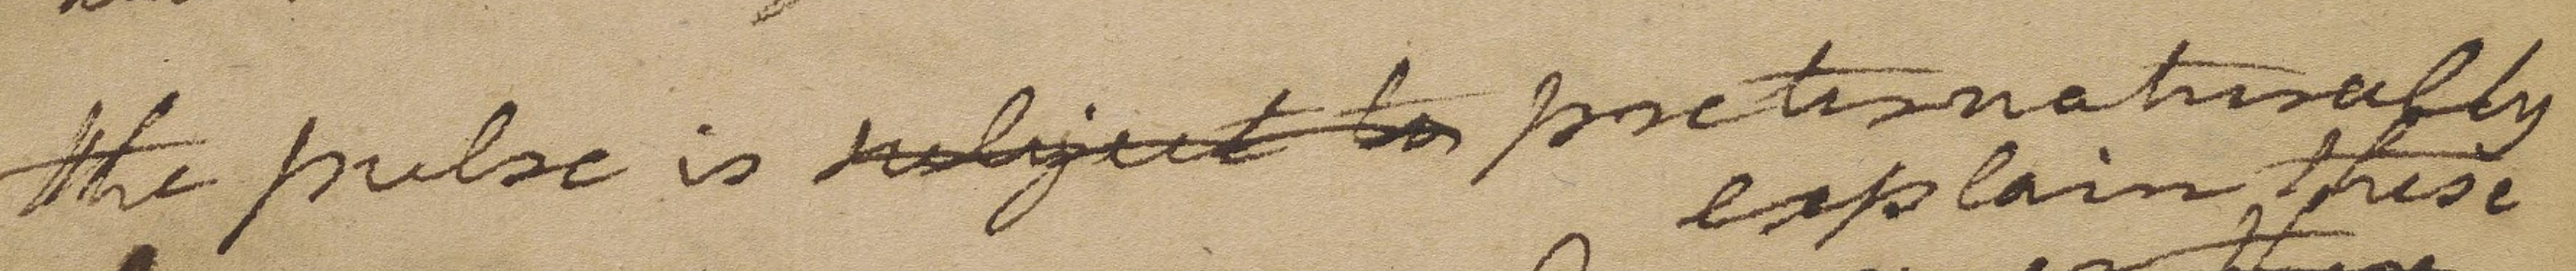the pulse is [subject to] preternaturally
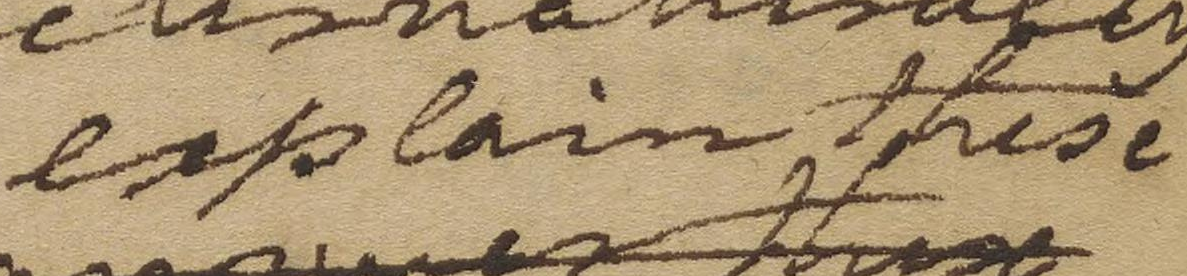explain these
